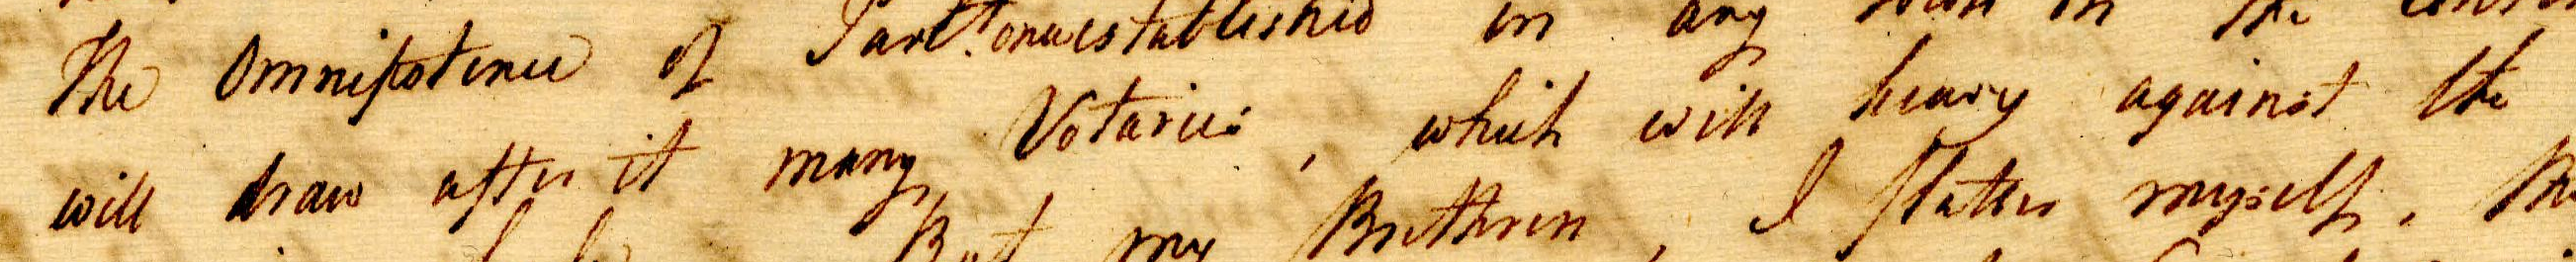will draw after it many Votaries, which will heavy against the
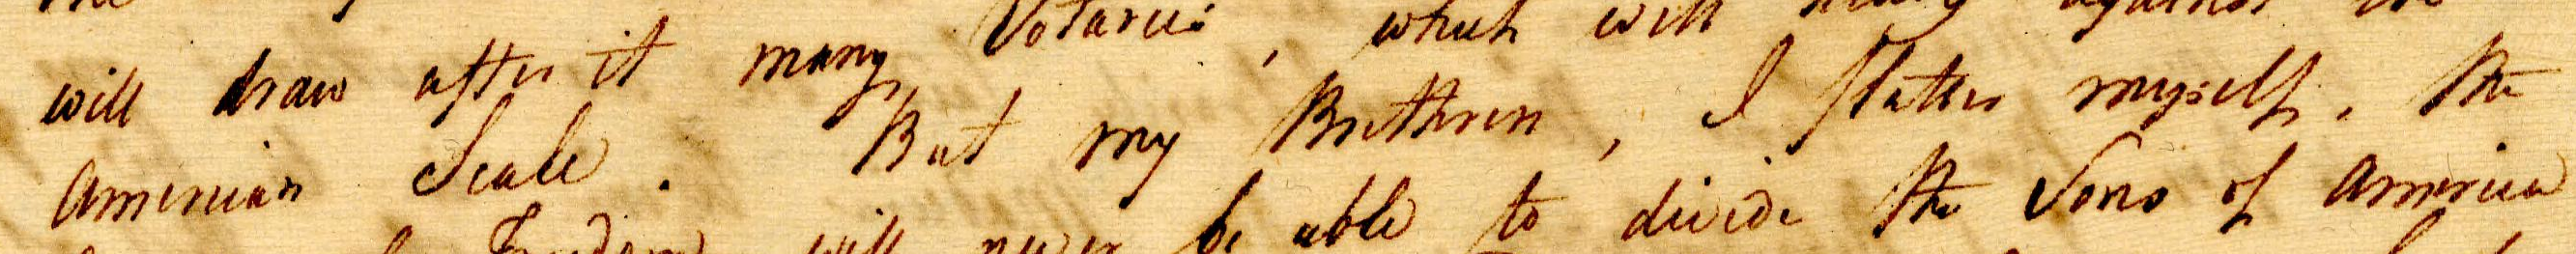American Scale. But my Brethren, I flatter myself, the
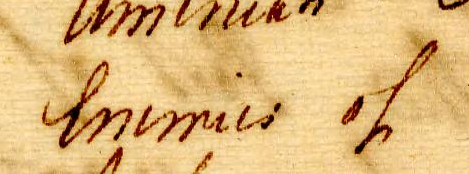Enemies of
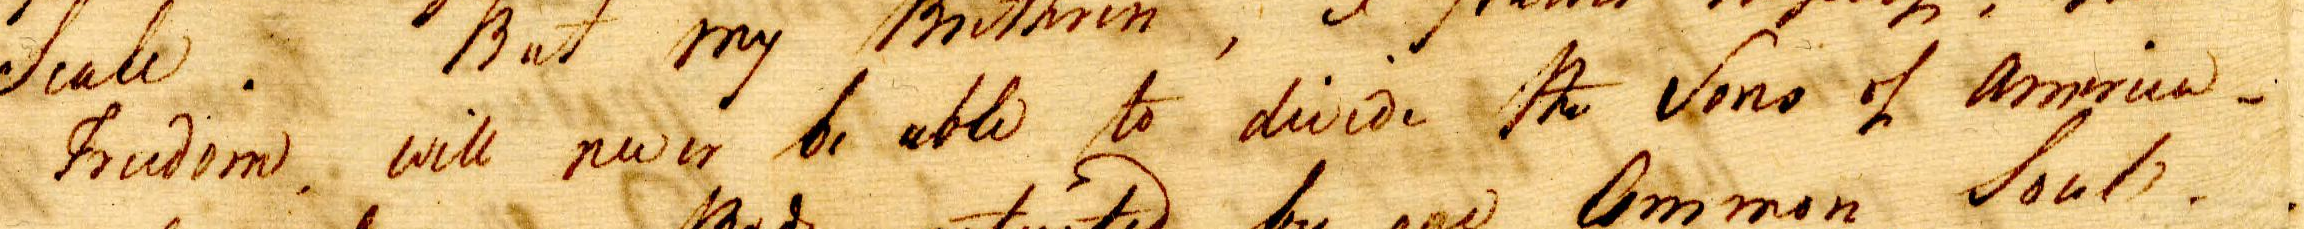Freedom will never be able to divide the Sons of America
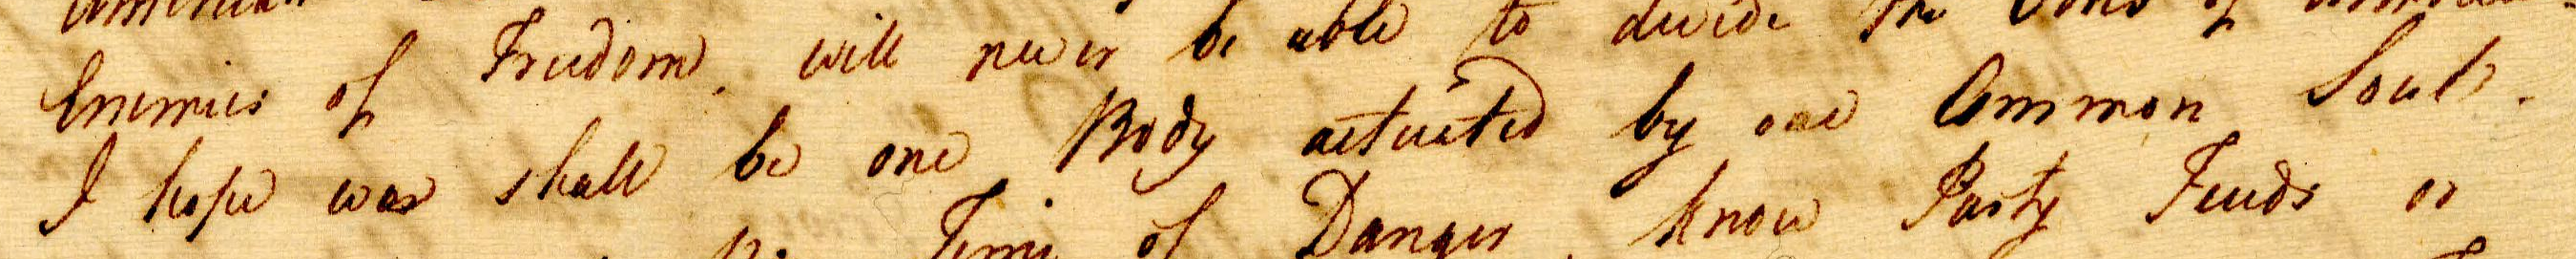I hope was shall be one Body actuated by one Common Soul.
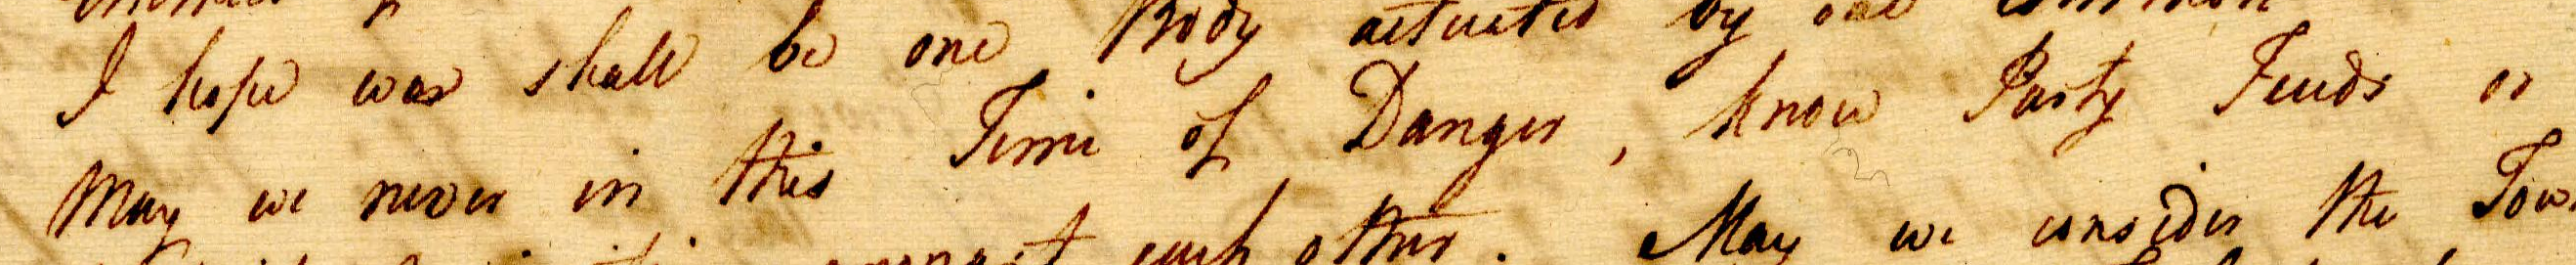May we never in this Time of Danger know Party Feuds or
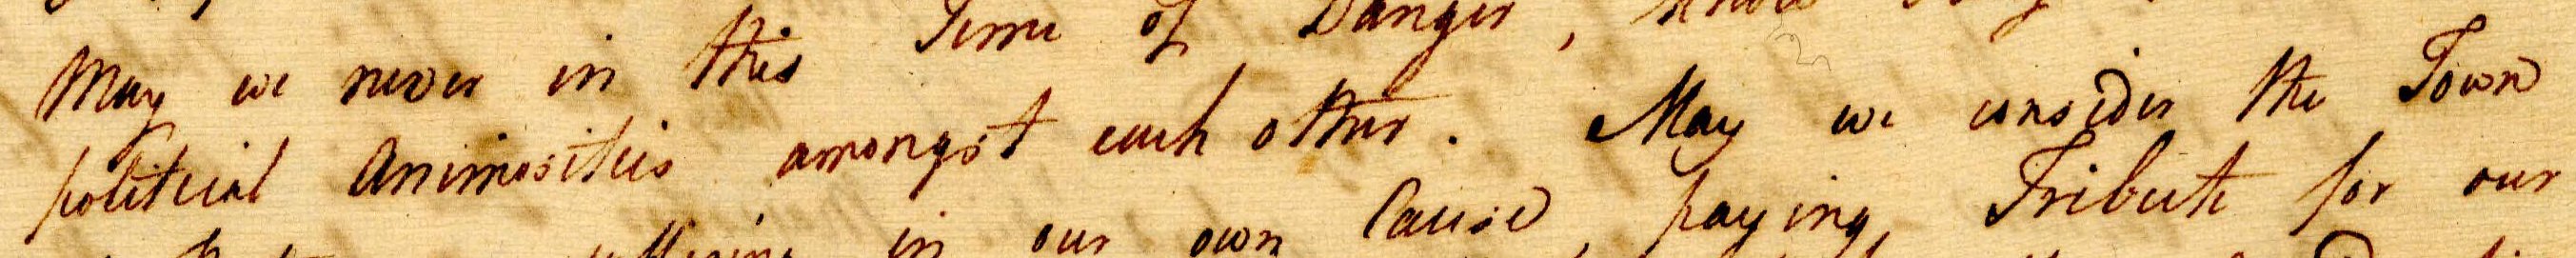political Animosities amongst each other. May we consider the Town
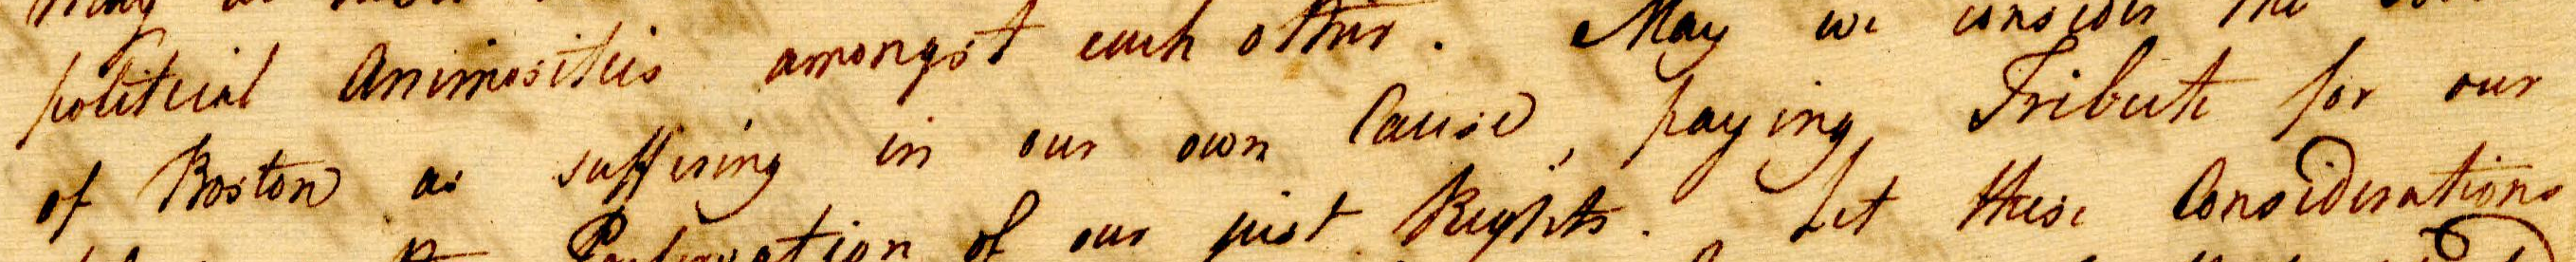of Boston as suffering in our own Cause, paying Tribute for our
